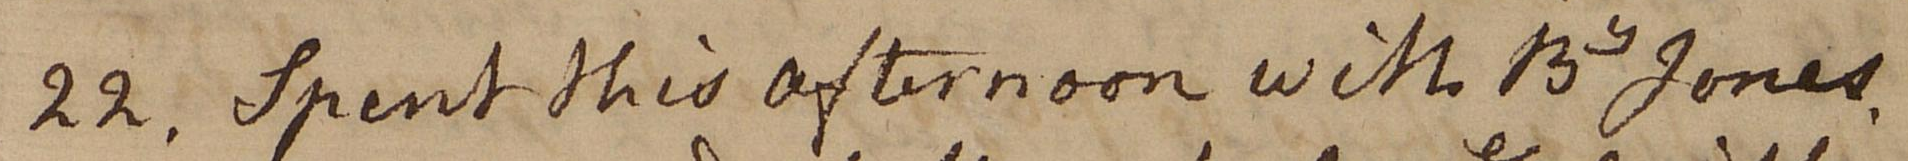22, Spent this afternoon with B^y Jones
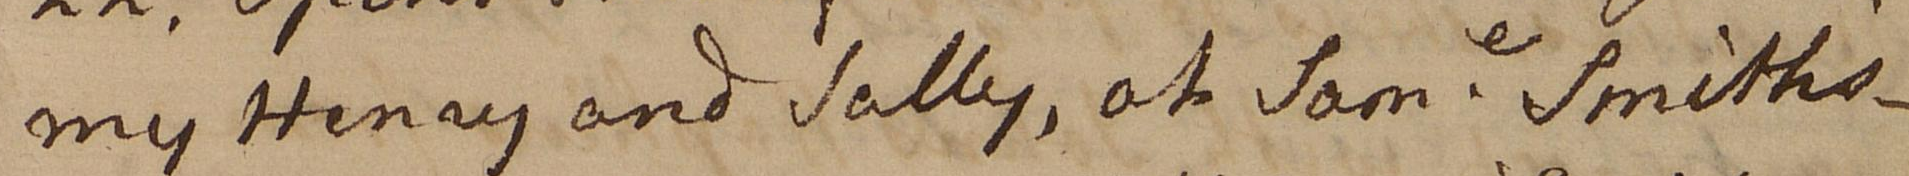my Henry and Sally, at Sam^l. Smiths-
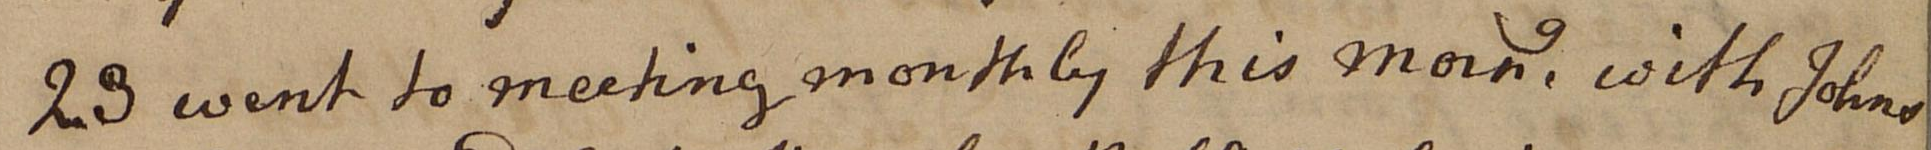23 went to meeting monthly this morn^g. with Johns
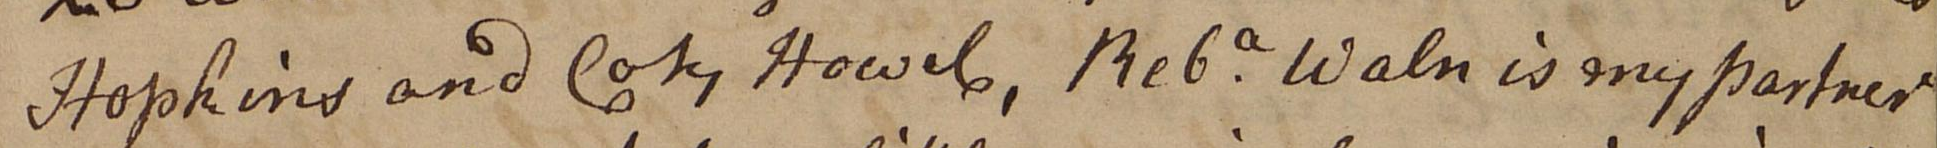Hopkins and Caty Howel, Reb^a. Waln is my partner
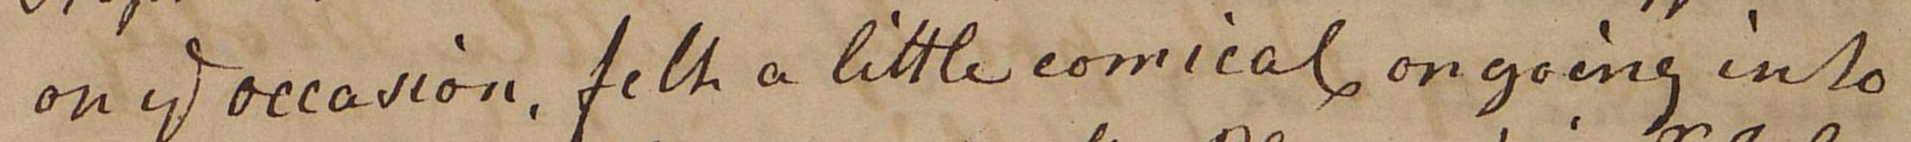on y^e occasion, felt a little comical ongoing in to
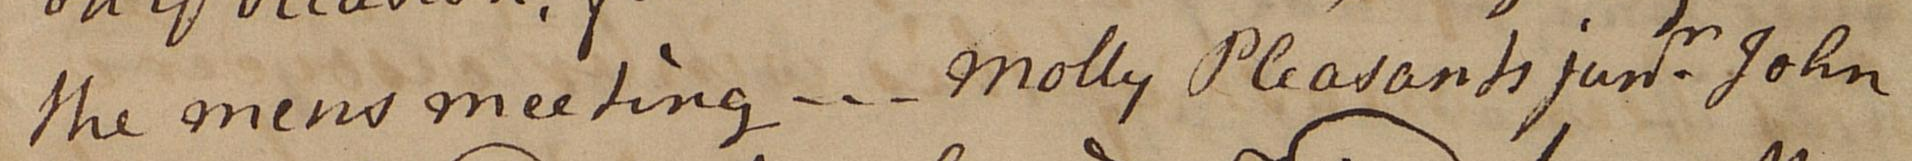the mens meeting--- Molly Pleasants jun^r. John
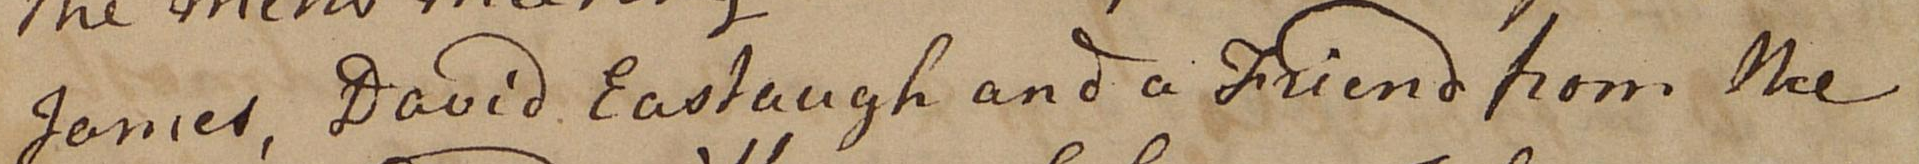James, David Eastaugh and a Friend from the
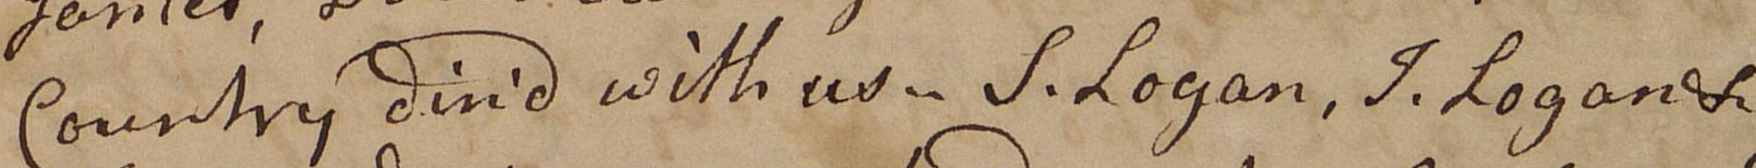Country din'd with us- S. Logan, I. Logan &c
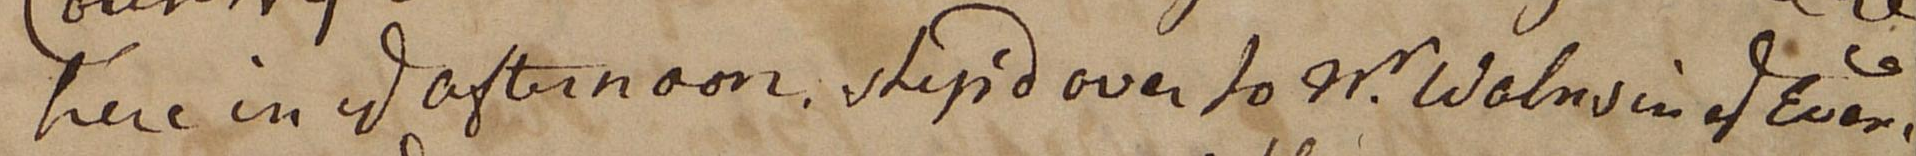here in y^e afternoon. step'd over to N^r. Walns in y^e Even^g.
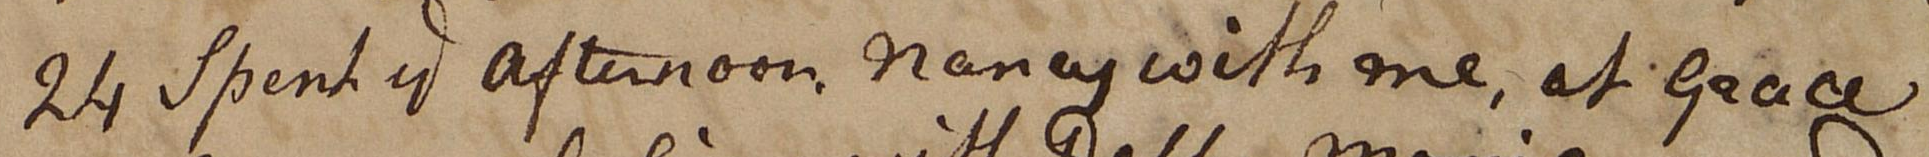24 Spent y^e afternoon. Nancy with me, at Grace
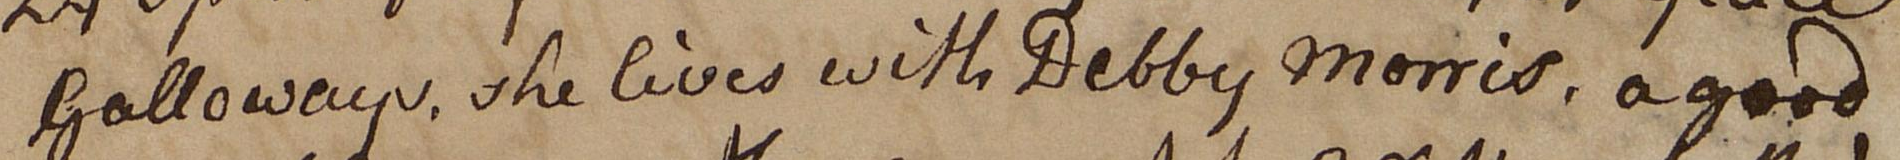Galloways, she lives with Debby Morris, a good
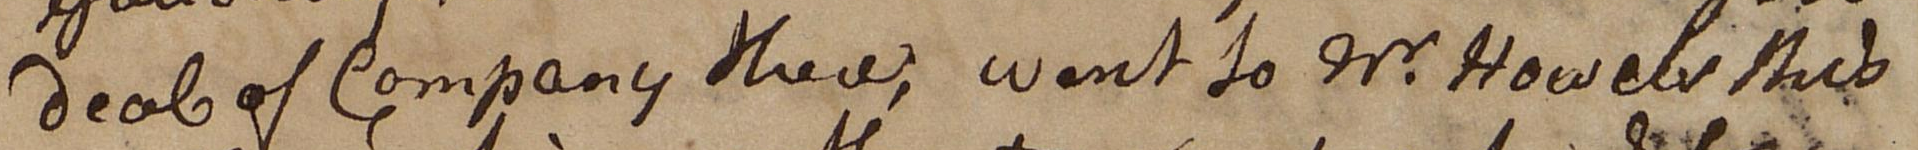deal of Company there, went so N^r. Howels this
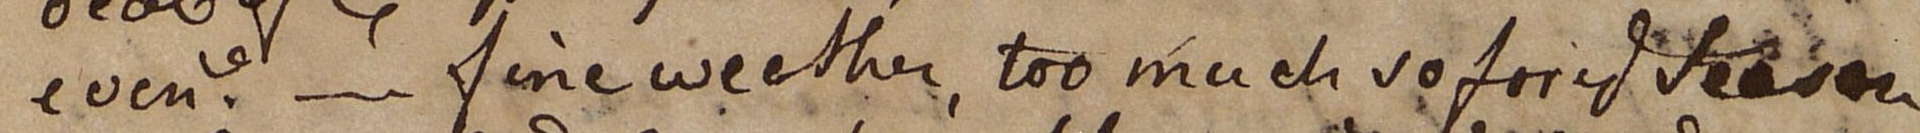even^g.- fine weather, too much so for y^e Season
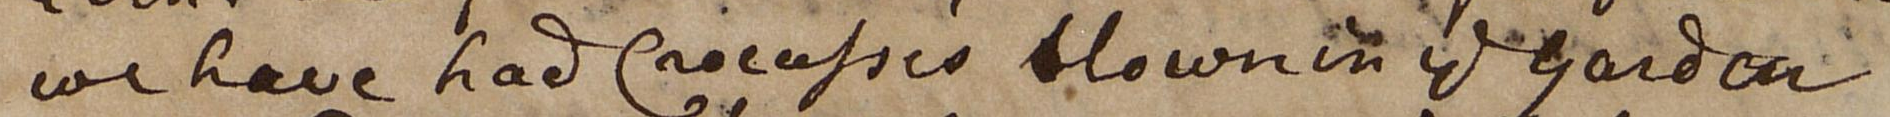we have had Crocasses blown in y^e Garden
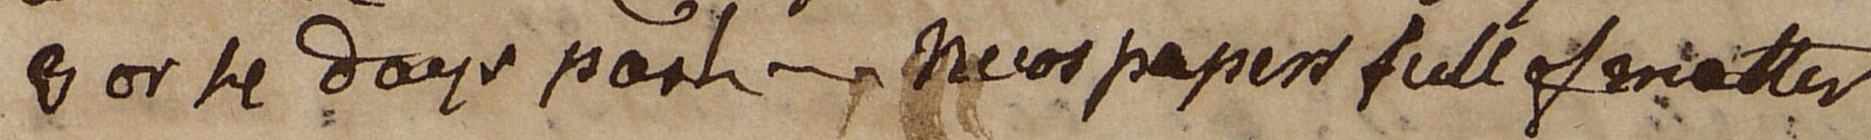3 or 4 days past- newspapers full of matter
